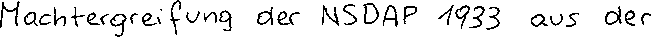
Machtergreifung der NSDAP 1933 aus der
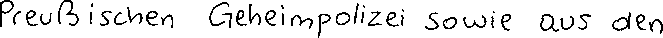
Preußischen Geheimpolizei sowie aus den
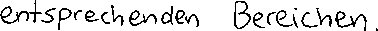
entsprechenden Bereichen
